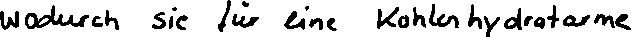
wodurch sie für eine kohlenhydratarme
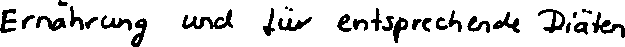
Ernährung und für entsprechende Diäten
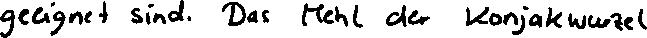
geeignet sind. Das Mehl der Konjakwurzel
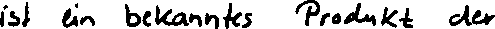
ist ein bekanntes Produkt der
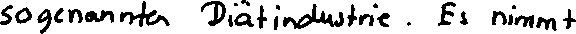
sogenannten Diätindustrie. Es nimmt
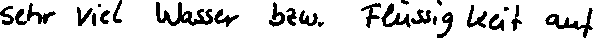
sehr viel Wasser bzw. Flüssigkeit auf
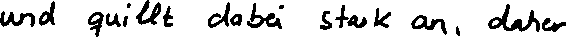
und quillt dabei stark an, daher
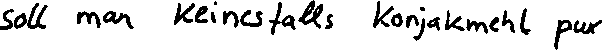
soll man keinesfalls Konjakmehl pur
